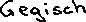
Gegisch
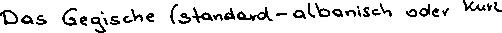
Das Gegische (standard-albanisch oder kurz
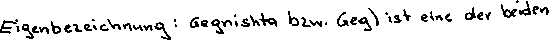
Eigenbezeichnung: Gegnishtja bzw. Geg) ist eine der beiden
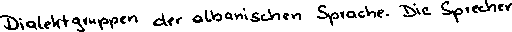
Dialektgruppen der albanischen Sprache. Die Sprecher
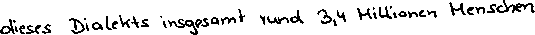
dieses Dialekts insgesamt rund 3,4 Millionen Menschen
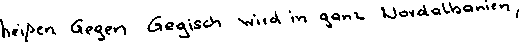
heißen Gegen Gegisch wird in ganz Nordalbanien,
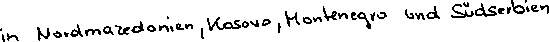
in Nordmazedonien, Kosovo, Montenegro und Südserbien
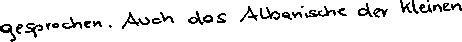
gesprochen. Auch das Albanische der kleinen
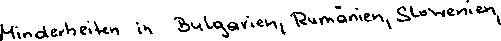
Minderheiten in Bulgarien, Rumänien, Slowenien,
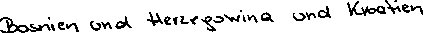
Bosnien und Herzegowina und Kroatien
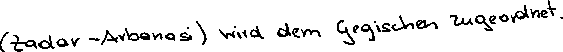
(Zadar-Arbanasi) wird dem Gegischen zugeordnet.
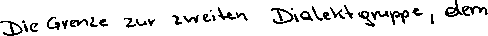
Die Grenze zur zweiten Dialektgruppe, dem
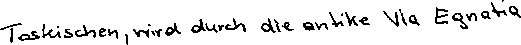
Toskischen, wird durch die antike Via Egnatia gebildet
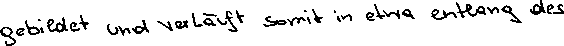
gebildet und verläuft somit in etwa entlang des
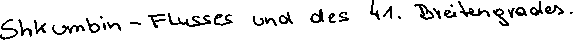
Shkumbin-Flusses und des 41. Breitengrades.
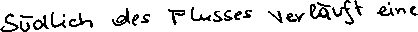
Südlich des Flusses verläuft eine
